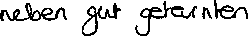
neben gut getarnten
